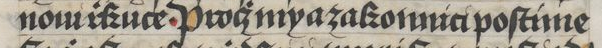noui ṙkuce.Procż my a zakonnici poſtíme
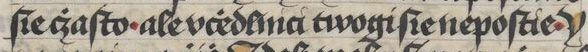ſie cżaſto.ale vċedlnici twogi ſie nepoſtie.Y
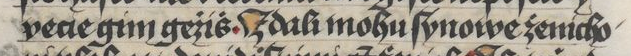vecie gim geżíṡ.Zdali mohu ſynowe żenicho¬
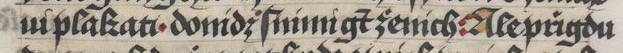ui plakati.donidż ſnimi ḡt żeních.Ale pṙigdu
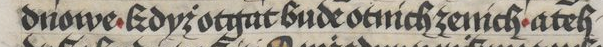dnowe.kdyż otgat bude otních zeních.a teh¬
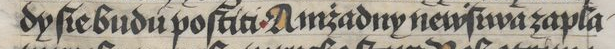dy ſie budú poſtiti.A niżadny newẛiwa zapla¬
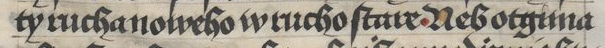ty rucha noweho w rucho ſtare.Neb otgima
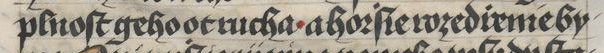plnoſt geho ot rucha.ahorẛie rozedṙeníe by¬
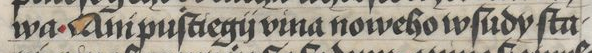wa.ginak puẛtiegij vina noweho vſudy ſta¬
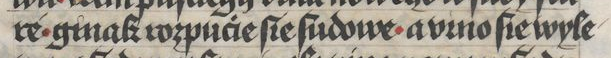ré.ginak rozpuċie ſie ſudowe.a vino ſie wyle¬
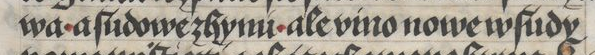wa.a ſudowe zhynú.ale víno nowe wſúdy
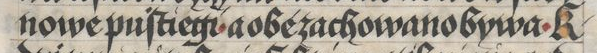nowe puẛtiegí.a obé zachowano bywa.K¬
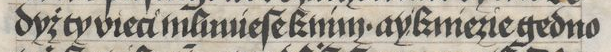dyż ty vieci mluuíeſe kním.aykníezie gedno
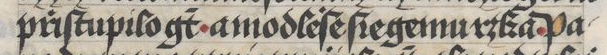pṙiſtupilo ḡt.a modleẛe ſie gemu rzka.Pa¬
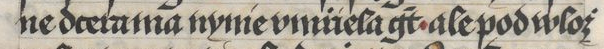ne dcera ma nyníe vmṙiela ḡt.ale pod wloż¬
